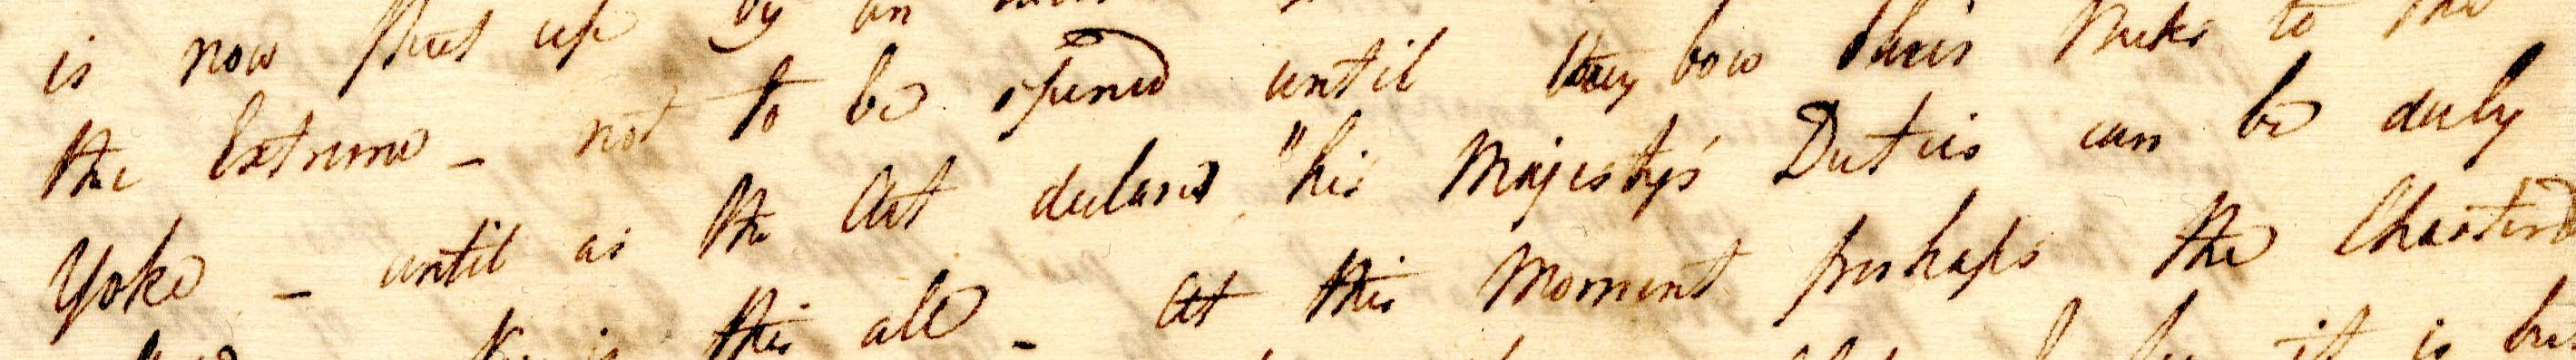Yoke- until as the Act declared his Majestys Duties can be duly
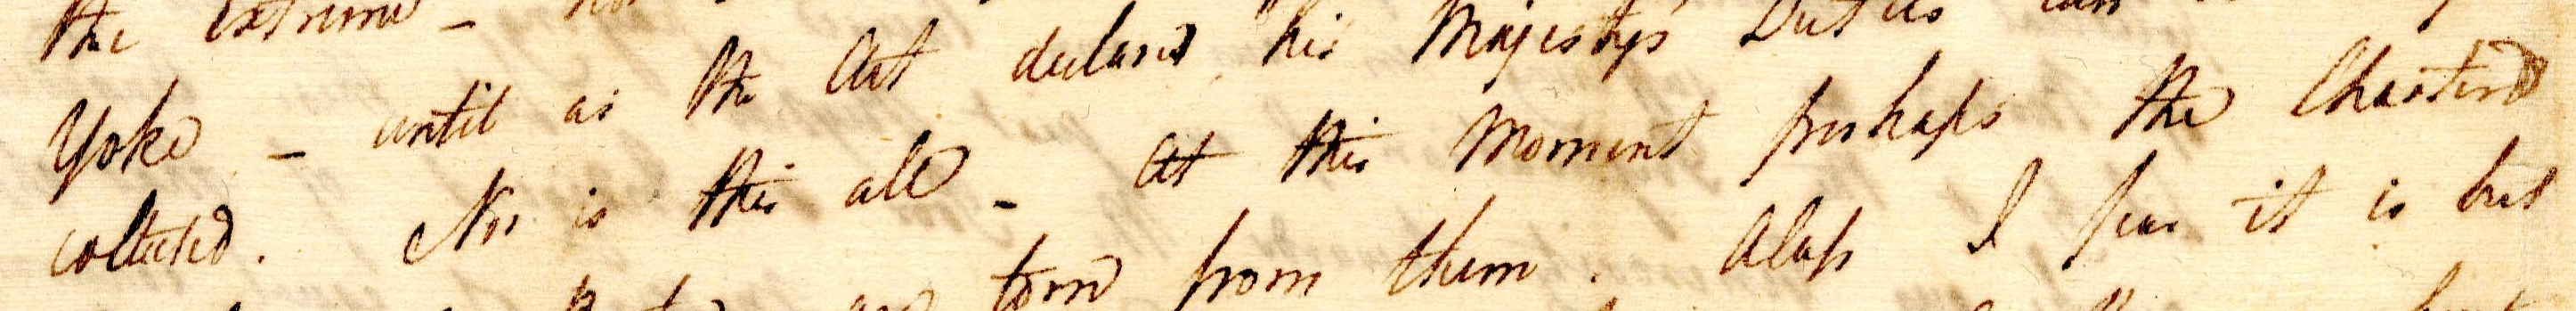collected. Nor is this all- At this Moment perhaps the Charter'd
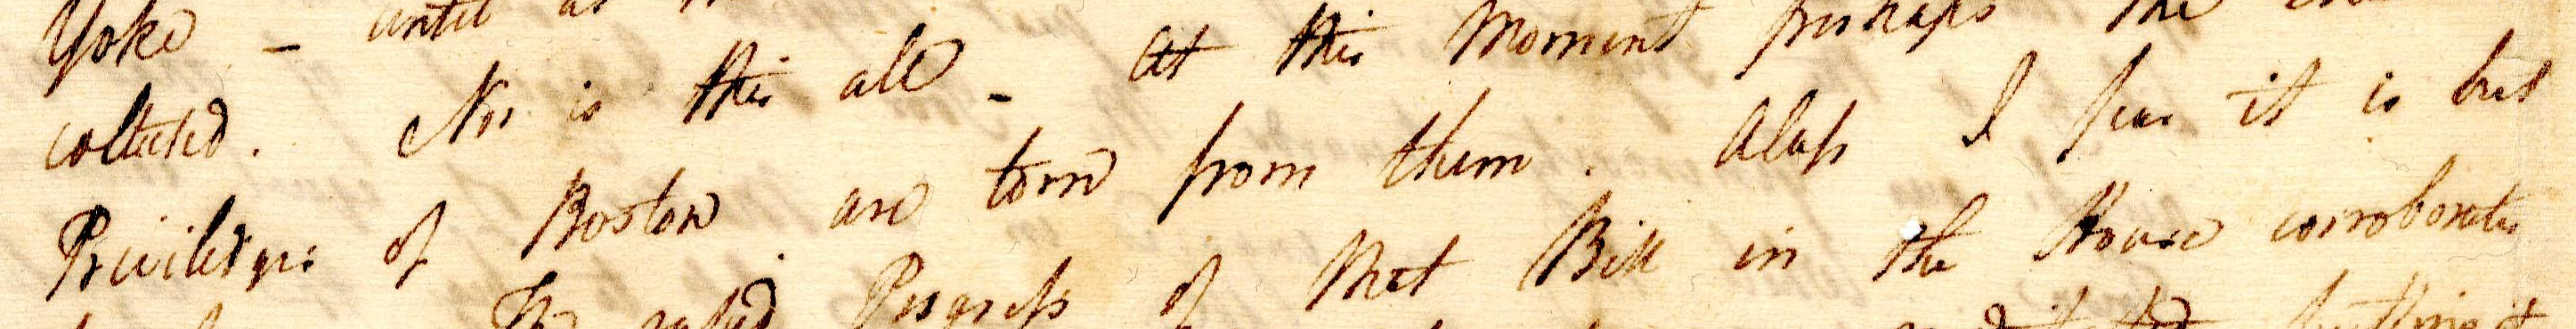Priviledge of Boston are torn from them. Alas, I fear it is but
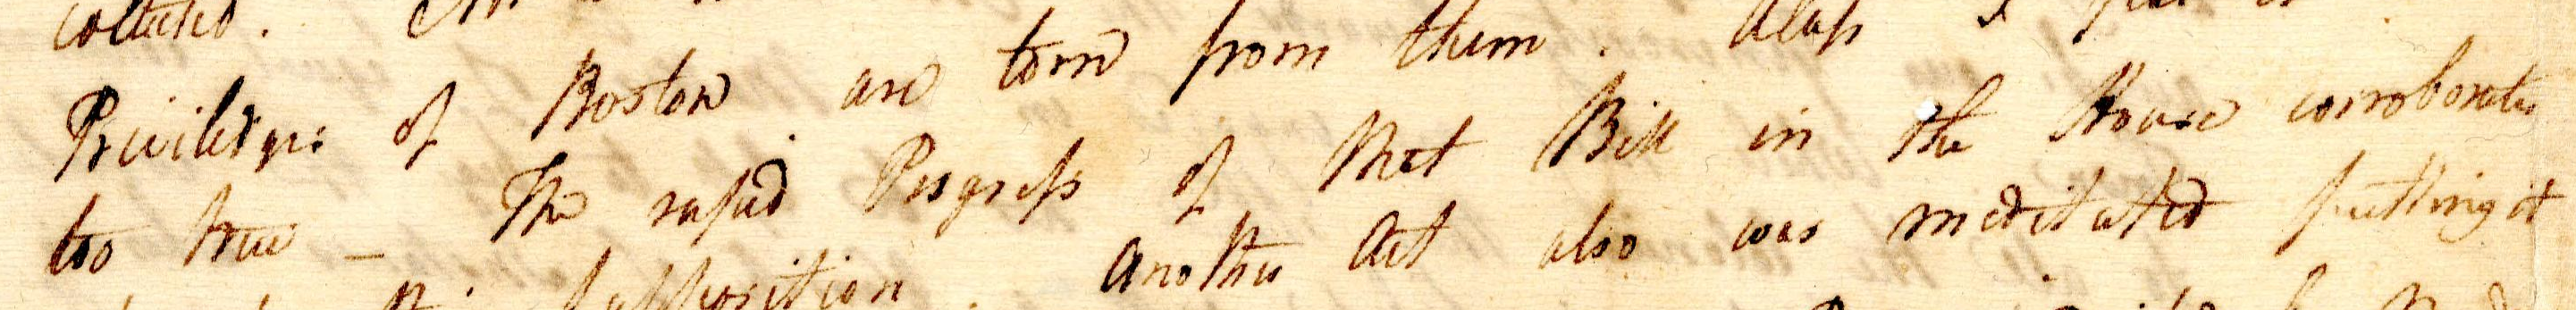too true. The saped Progress of that Bill in the House corroborates
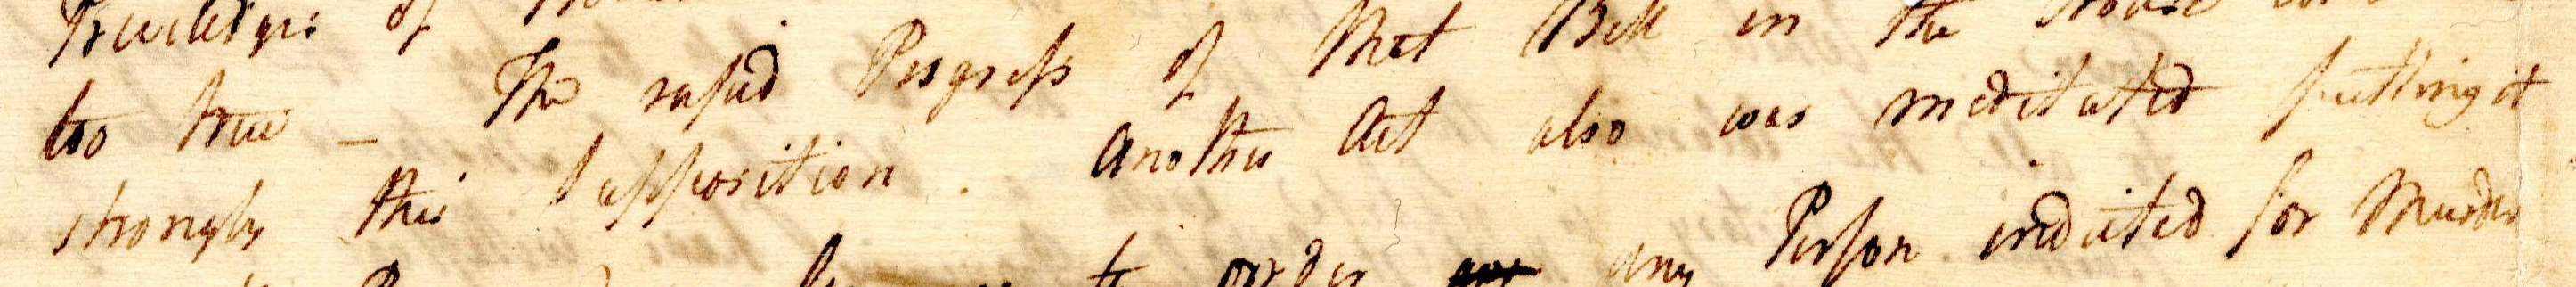strongly this Supposition. Another Act also was meditated putting it
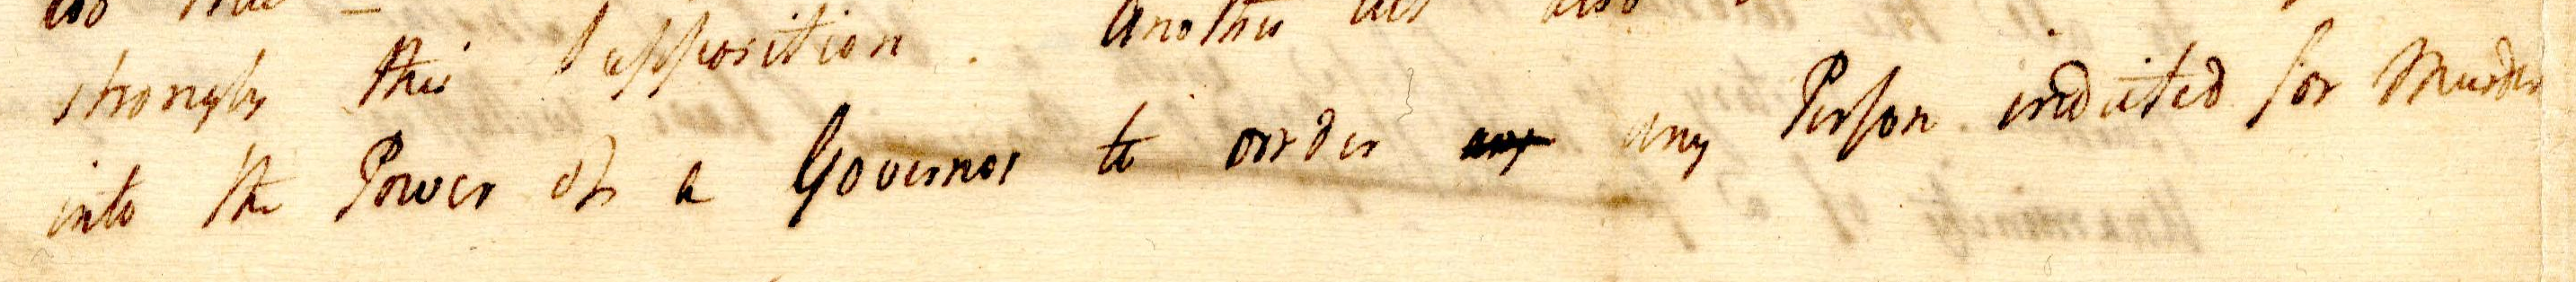into the Power of a Governor to order any any Person indicted for Murder
